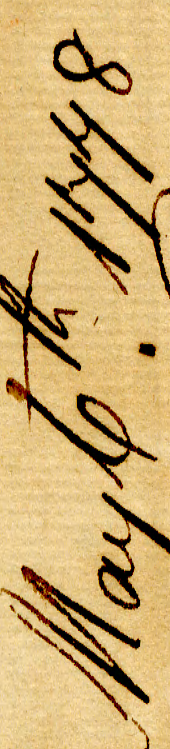May 6^th. 1778
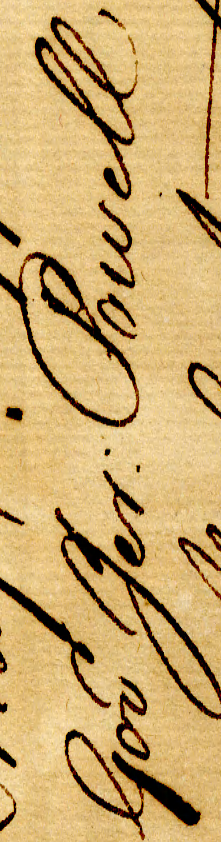Govr Jer: Powell
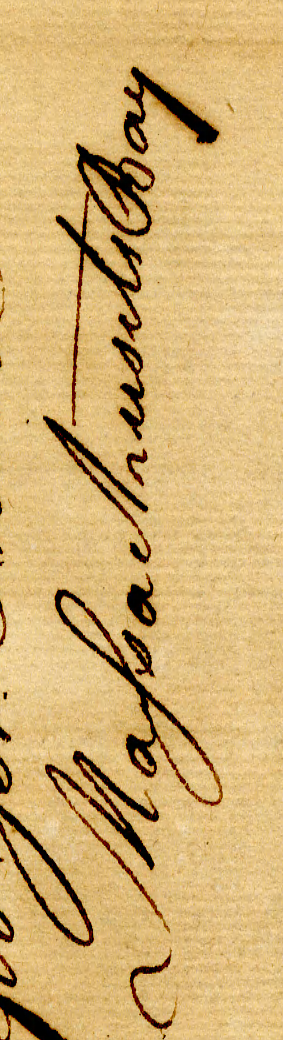Massachusets Bay
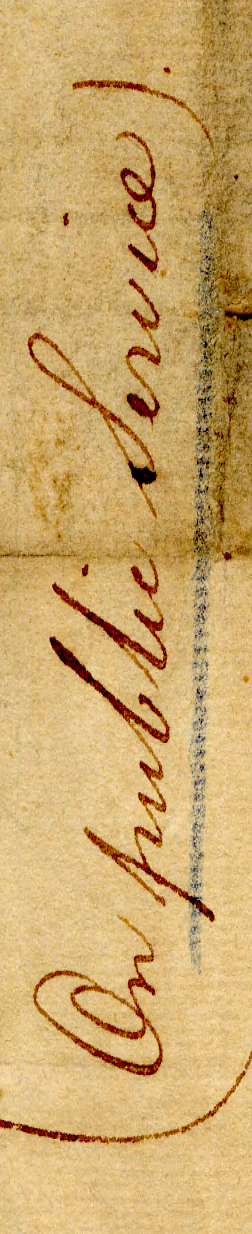(On public Service)
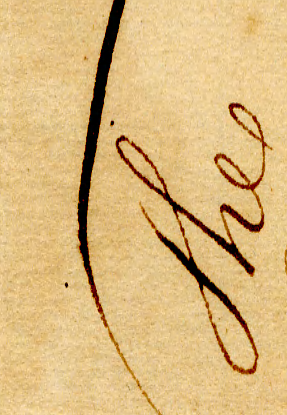The
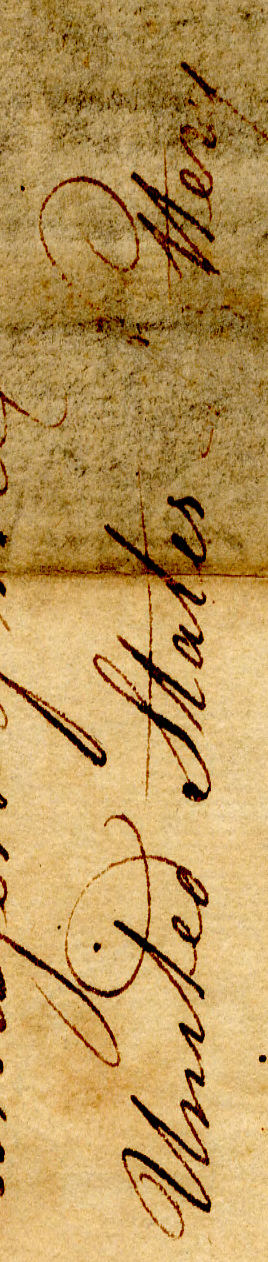United States L[_]ttery
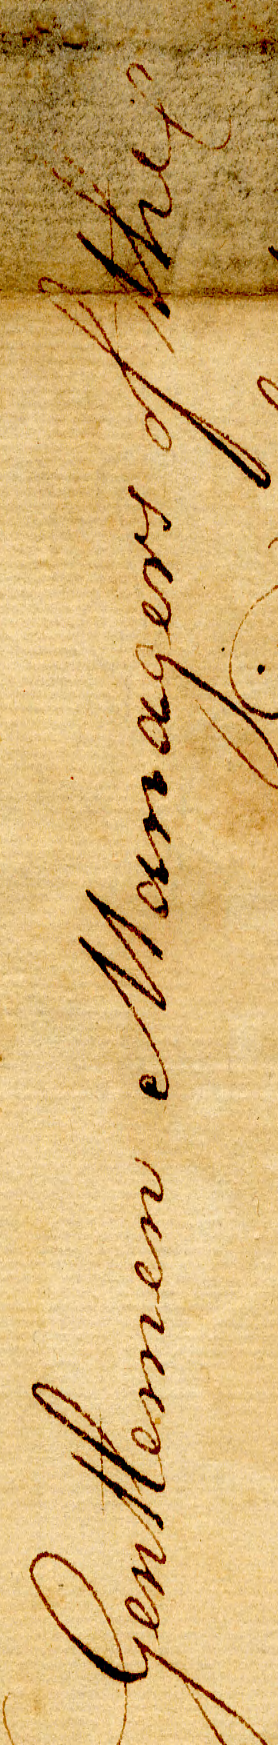Gentlemen Managers of the
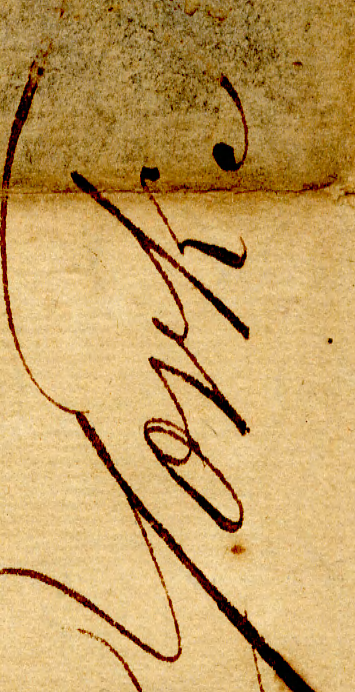Yorke
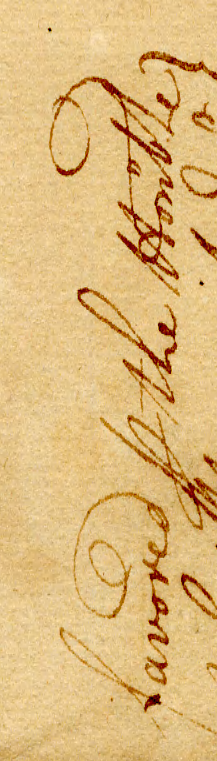favored & the Honble
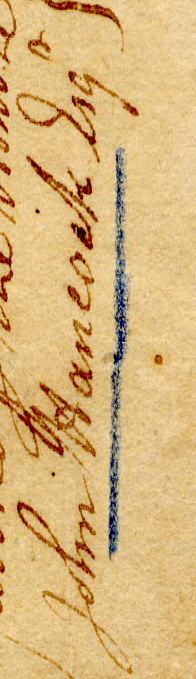John Hancock Esq^r
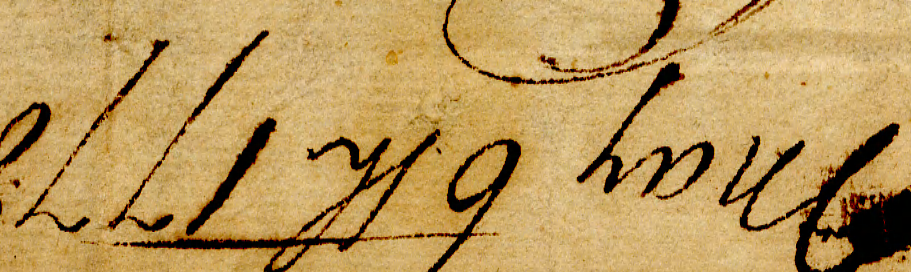May 6th 1778
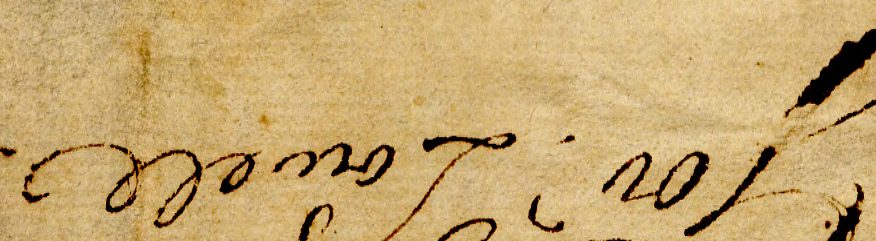Gov^r. Powell
